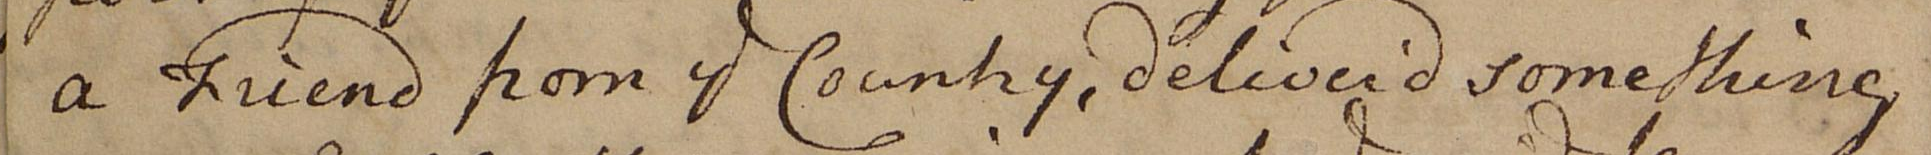a friend from y^e Country, deliver'd something
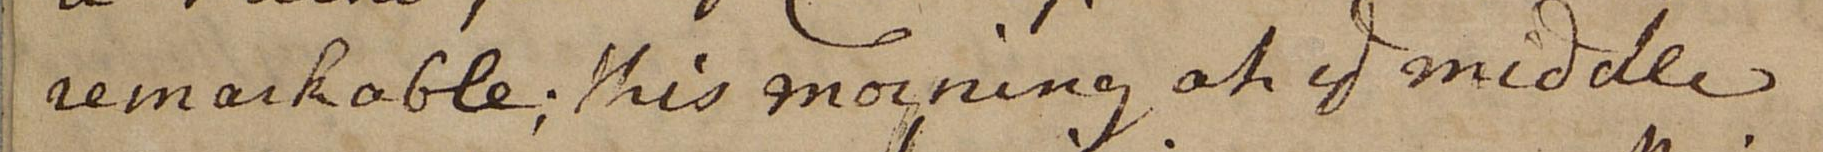remarkable; this morning at y^e middle
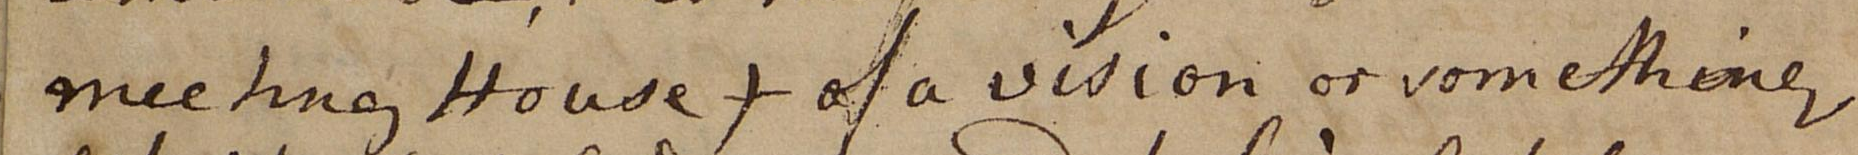meeting House - of a vision or something
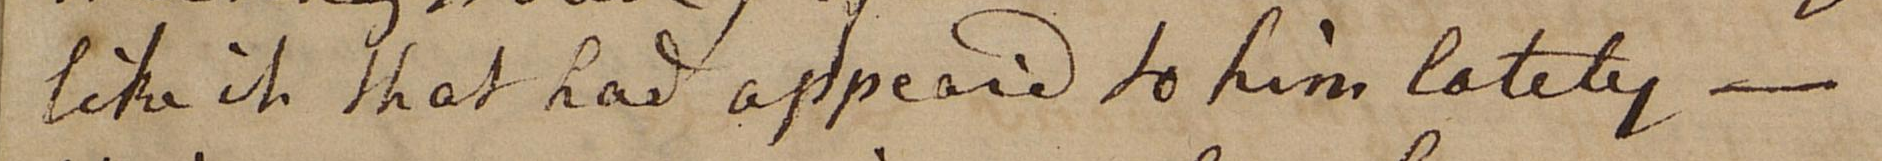like it that had appear'd to him lately-
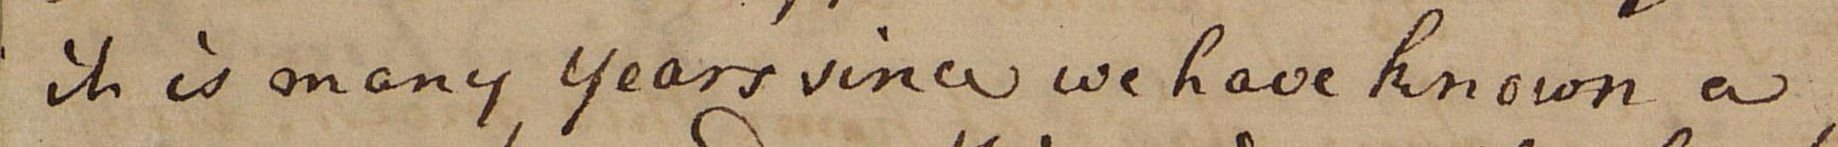it is many years since we have known a
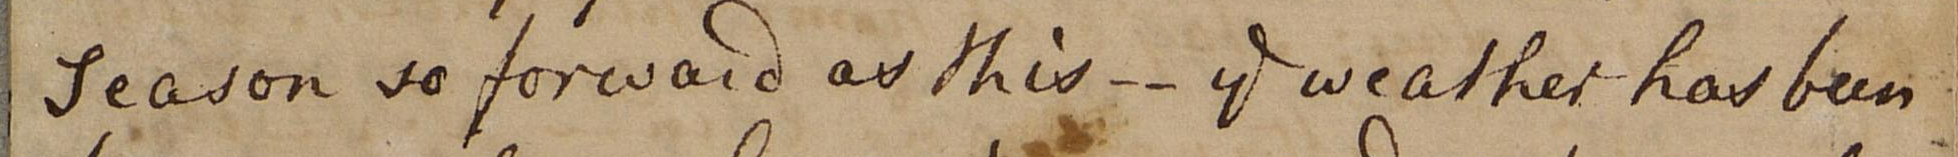season so forward as this-- y^e weather has been
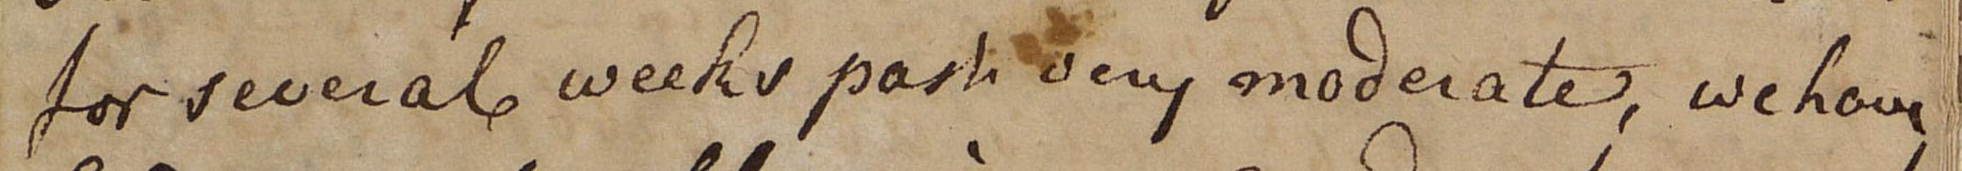fo several weeks past very moderate, we have
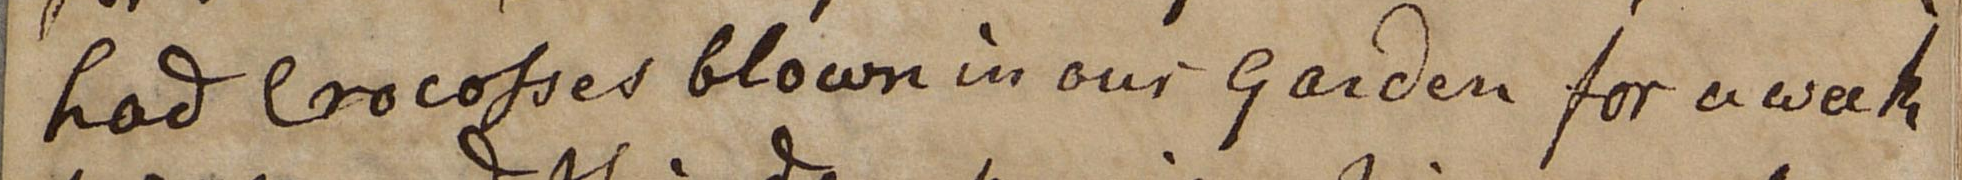had Crocosses blown in our Garden for a week
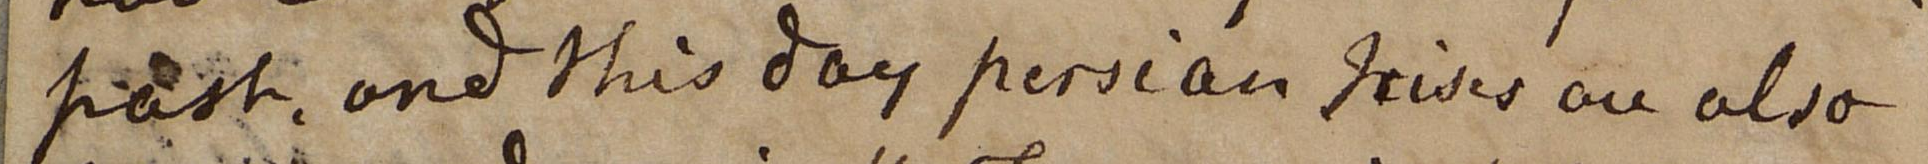past and this day persian Irises are also
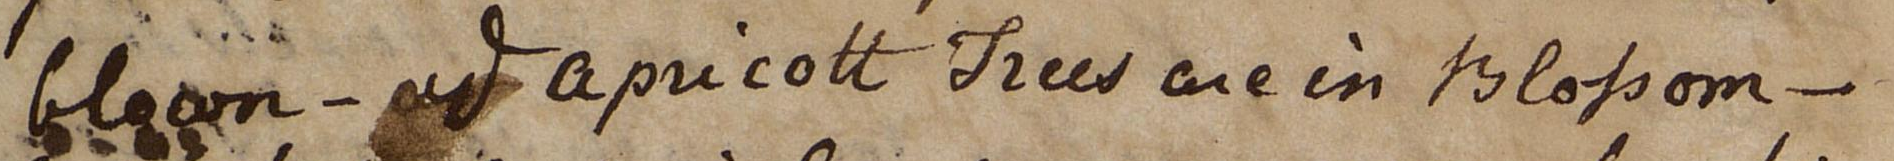bloan- y^e apricott Trees are in Blossom-
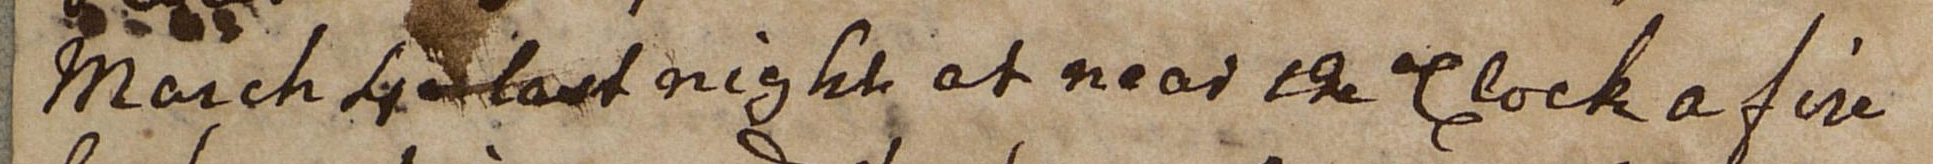March 4 last night at near 12 ^oClock a fire
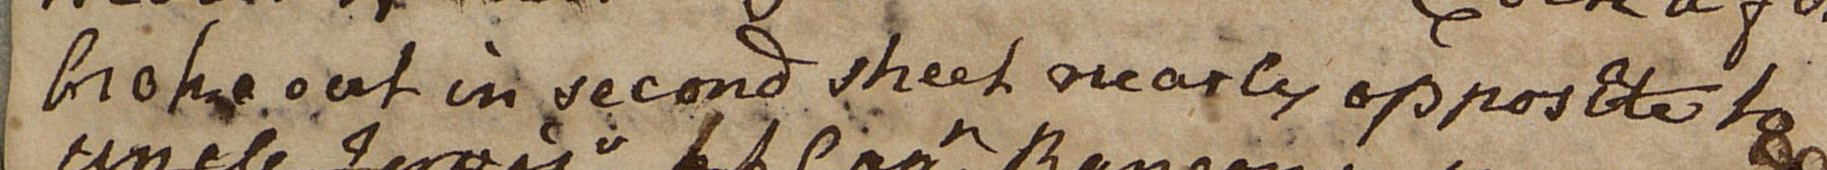broke out in second sheet nearly opposite to
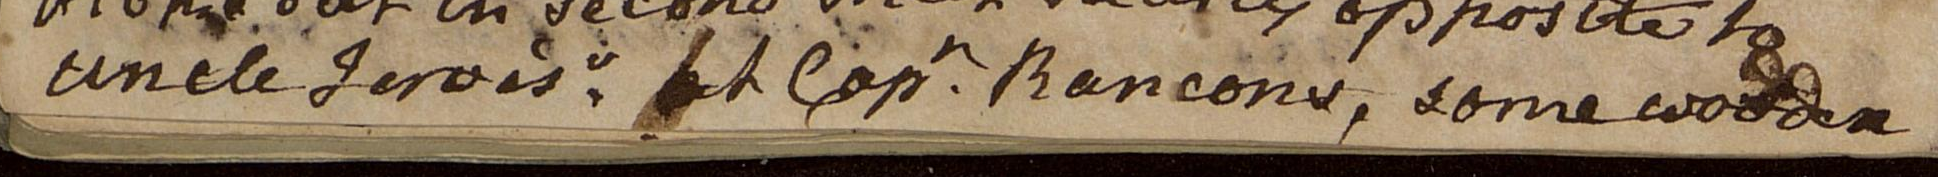Uncle Jervis^s. at Cap^n. Rancons, some wodden
